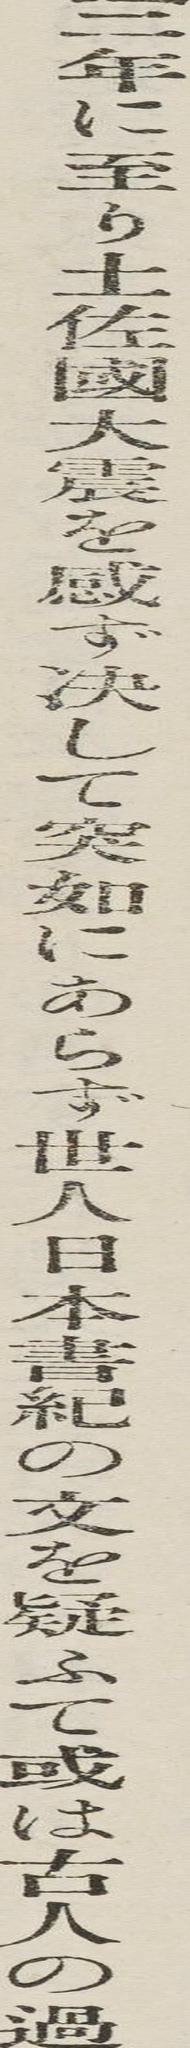三年に至り土佐国大震を感ず決して突如にあらず世人日本書紀の文を疑ふて或は古人の過
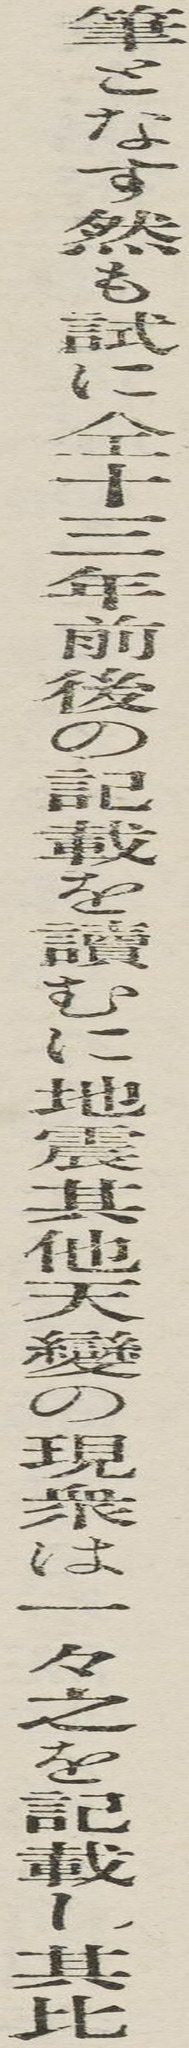筆となす然も試に同十三年前後の記載を読むに地震其他天変の現象は一々之を記載し其比

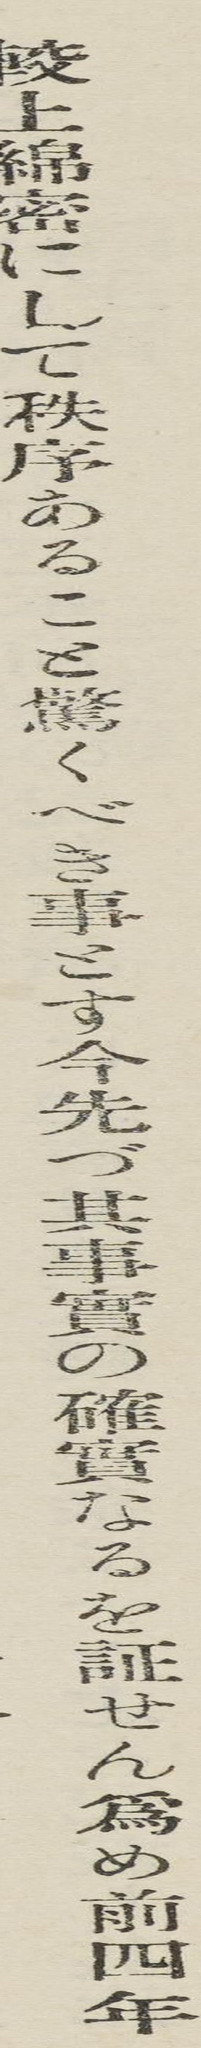較上綿密にして秩序あること驚くべき事とす今先づ其事実の確実なるを証せん為め前四年
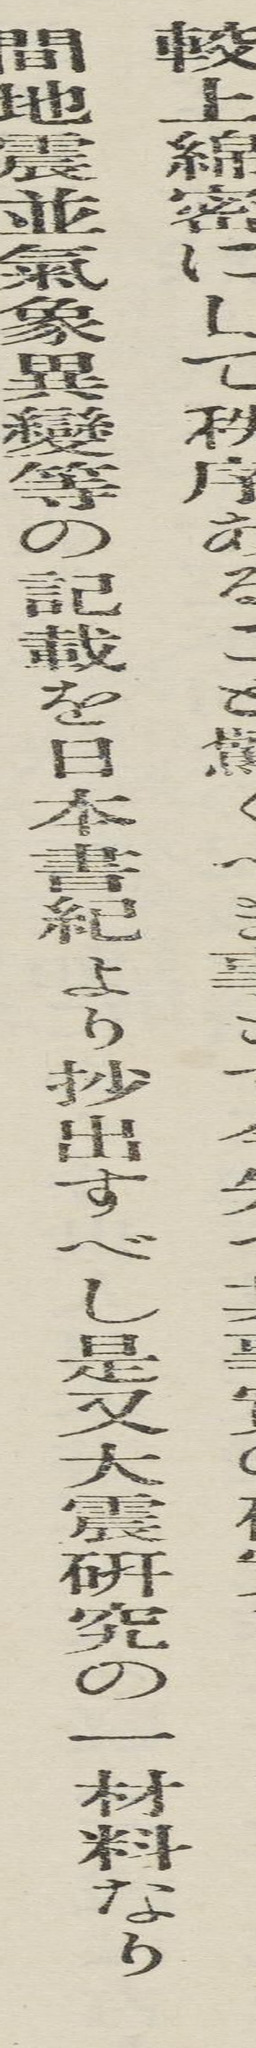間地震並気象異変等の記載を日本書紀より抄出すべし是又大震研究の一材料なり
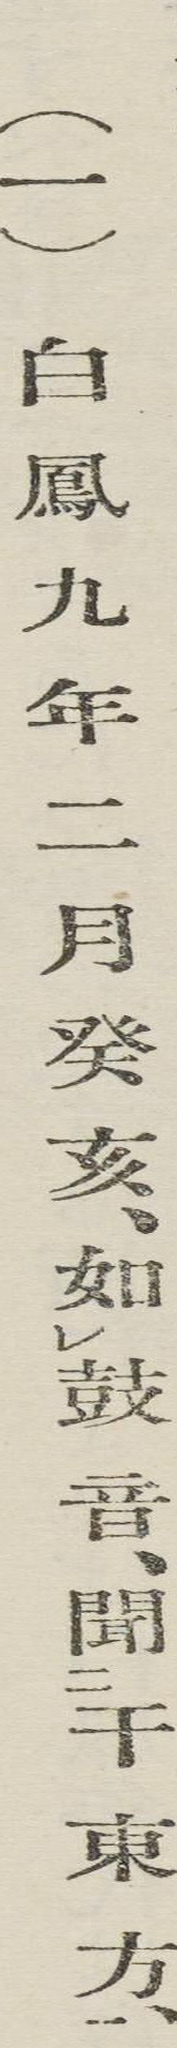白鳳九年二月癸亥、如鼓音、聞于東方、
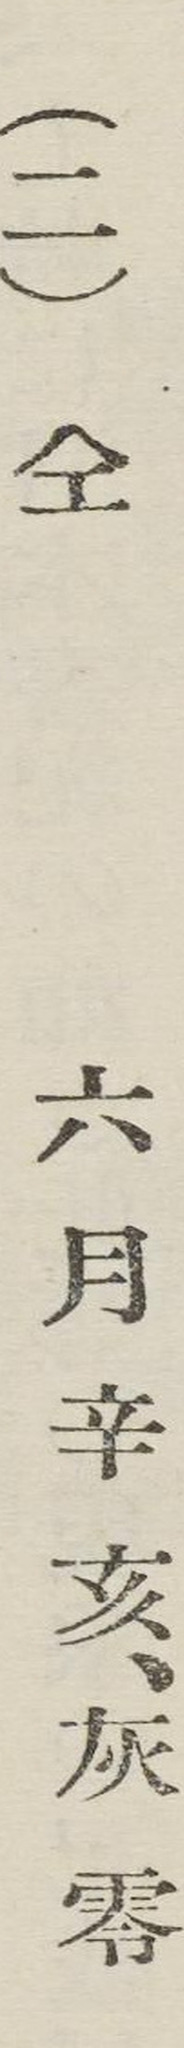同六月辛亥、灰零
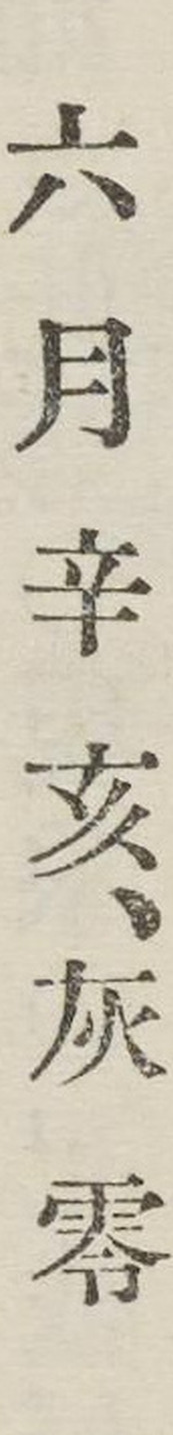同六月辛亥、灰零
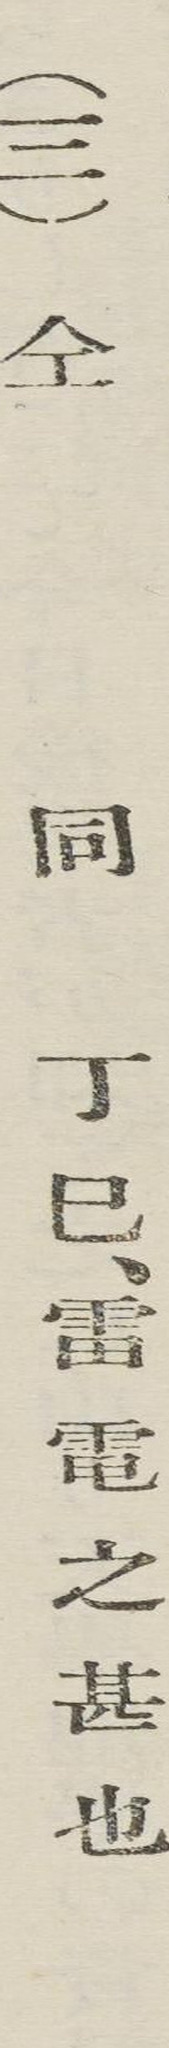同同丁巳、雷電之甚也
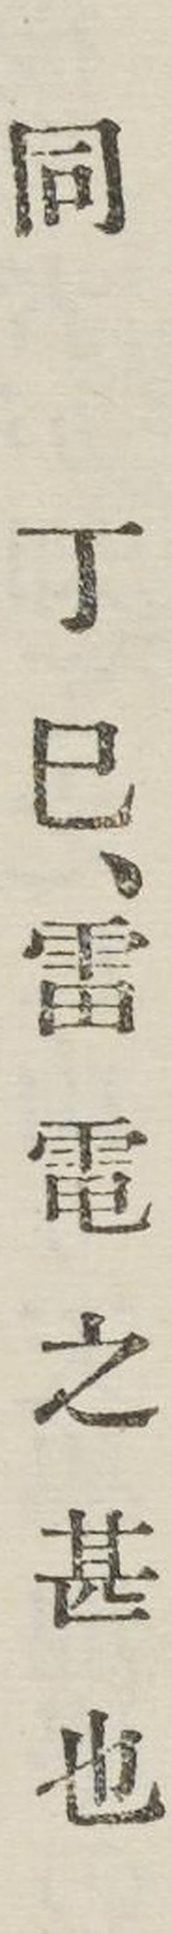同同丁巳、雷電之甚也
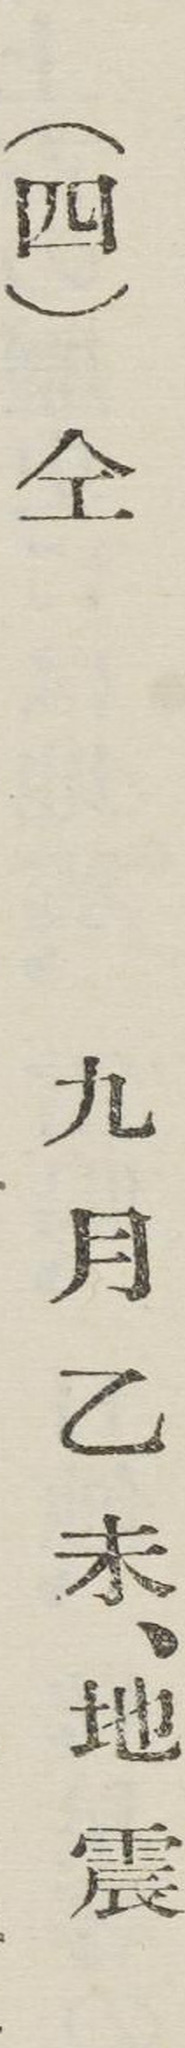同九月乙未、地震
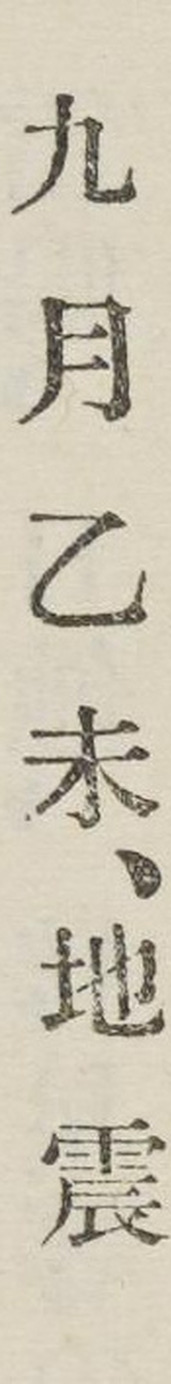同九月乙未、地震
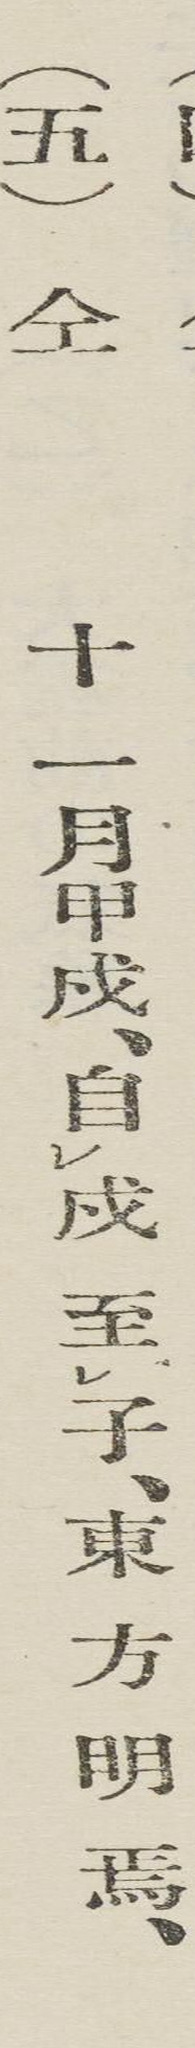同十一月甲戌、自戌至子、東方明焉、
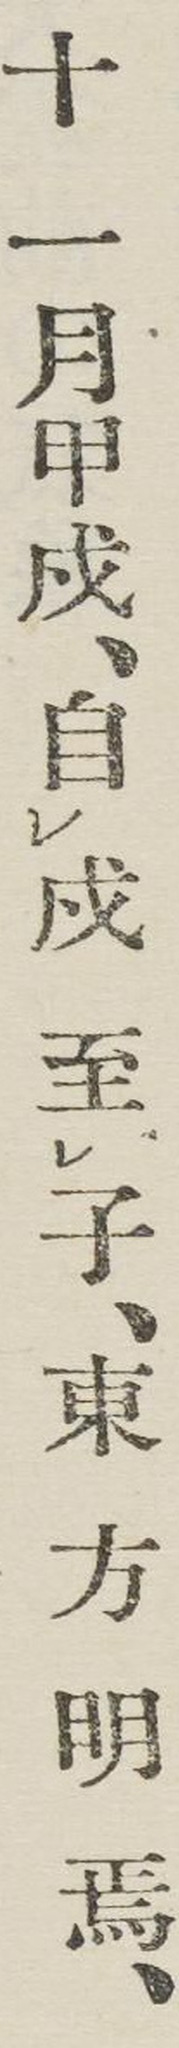同十一月甲戌、自戌至子、東方明焉、
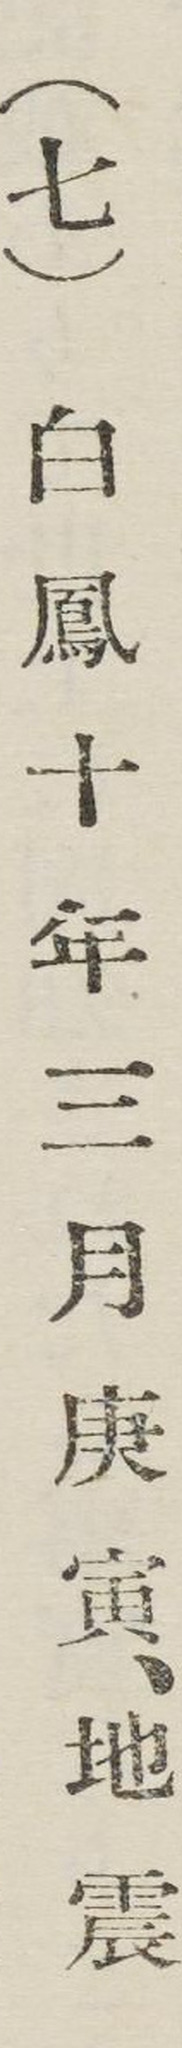白鳳十年三月庚寅、地震
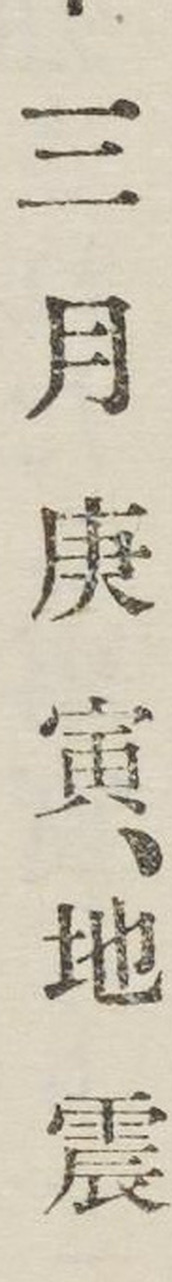同三月庚子、地震
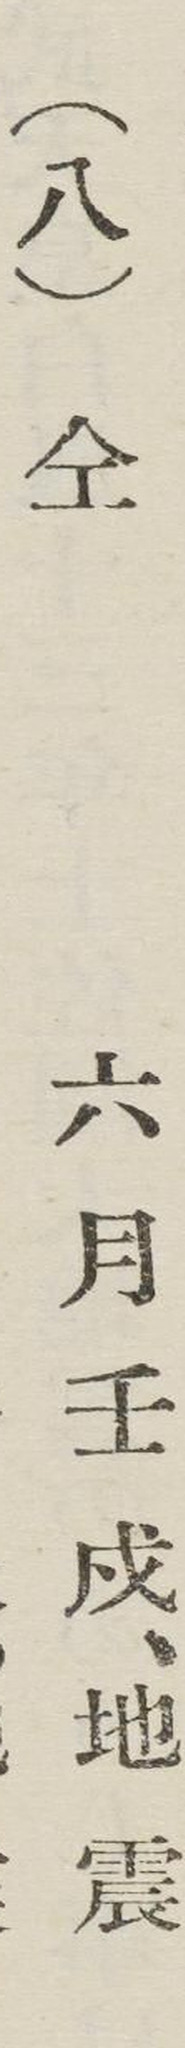同六月壬戌、地震
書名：土佐古今ノ地震
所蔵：東京大学地震研究所図書室 Earthquake Research Institute Library, The University of Tokyo, JAPAN
